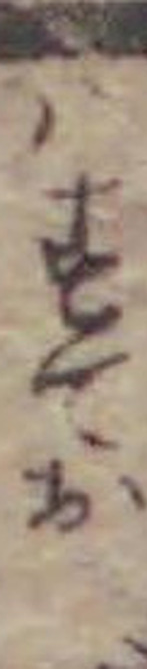はすてお

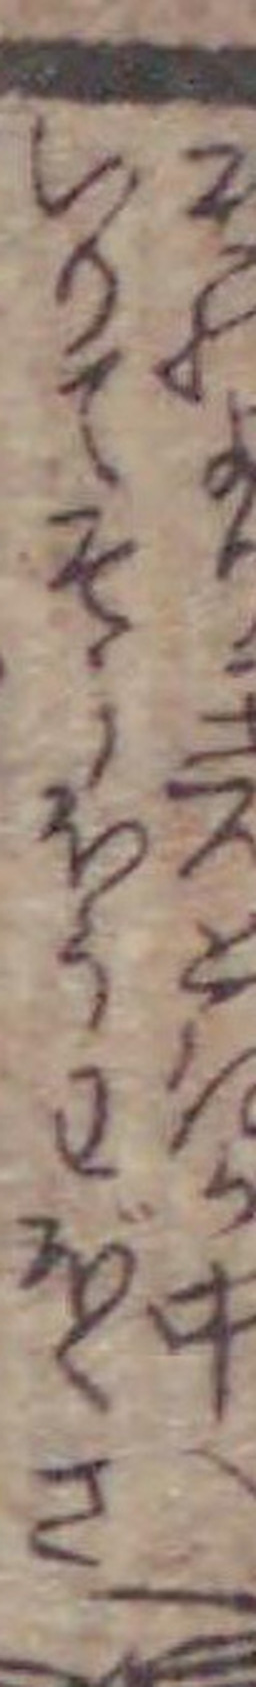いりてそうほうわぼくさ
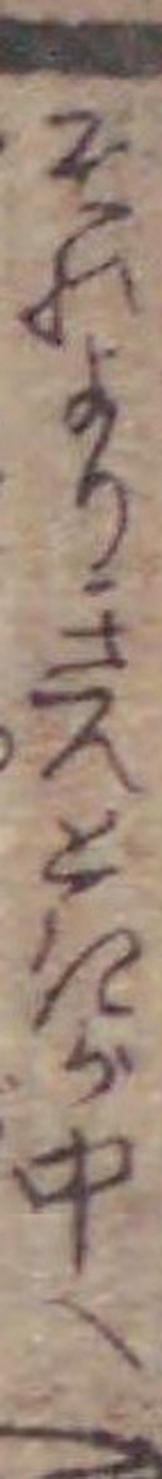それよりきんときが中へ
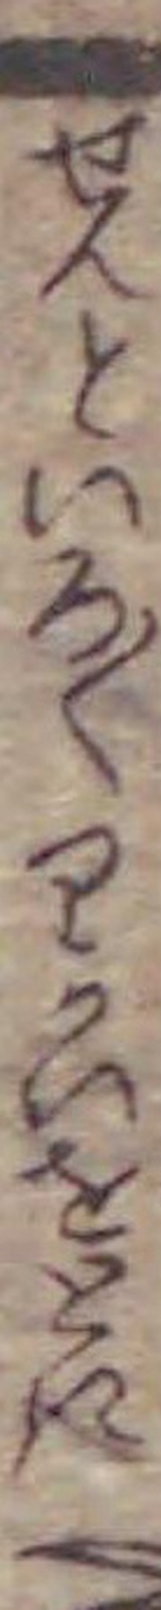せんといろ〳〵りかいをとき
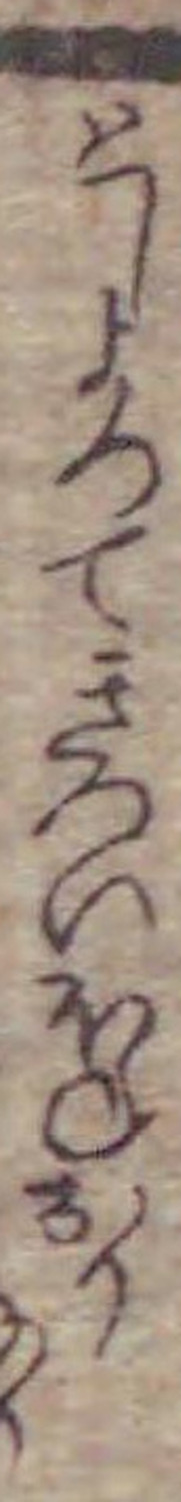としよつてきついほねおり
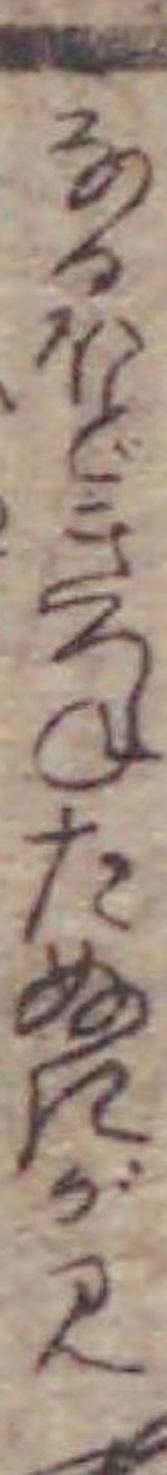なるほどきつねたぬきが見
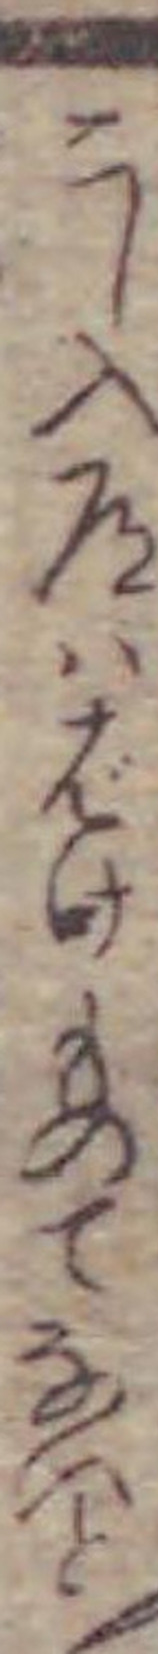こし入道はばけものてないと
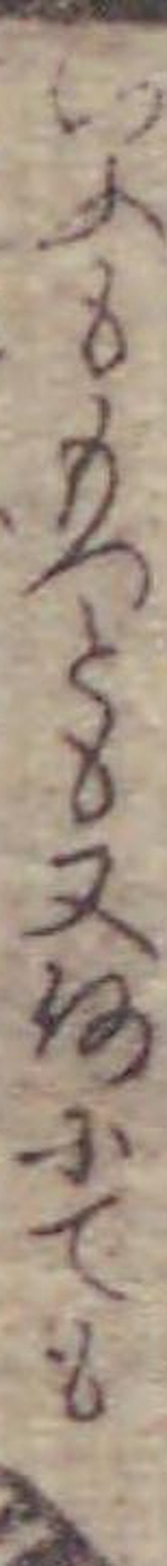いふももつとも又何ても
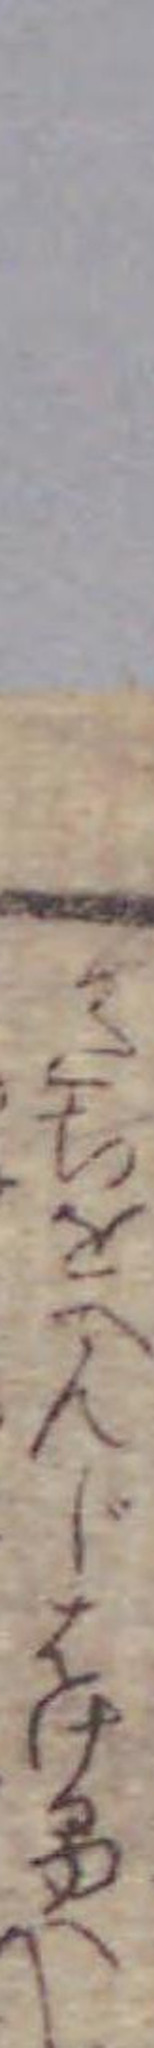かたちをへんじはけるゆへ
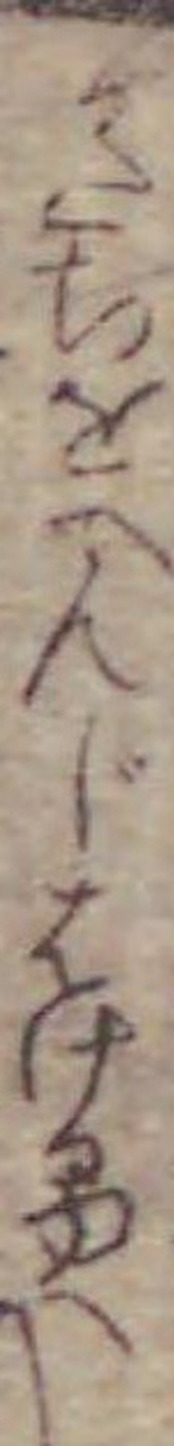かたちをへんじはけるゆへ
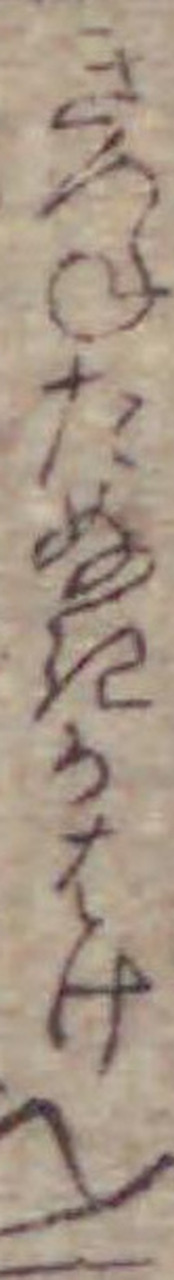きつねたぬきかはけ
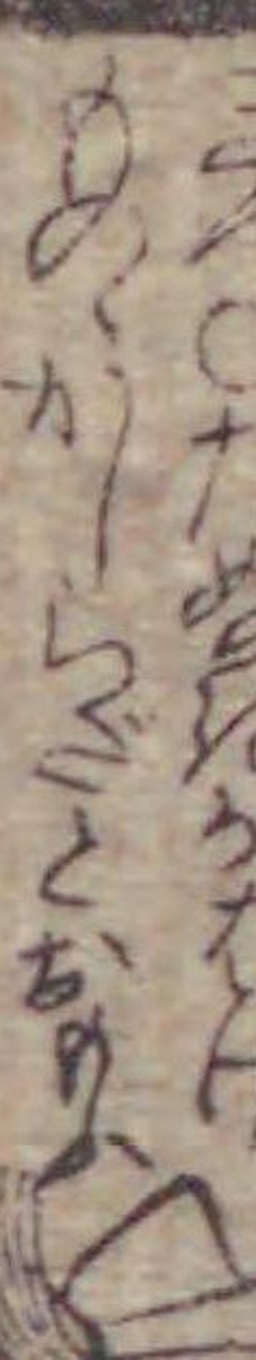ものゝかしらだとおもふ
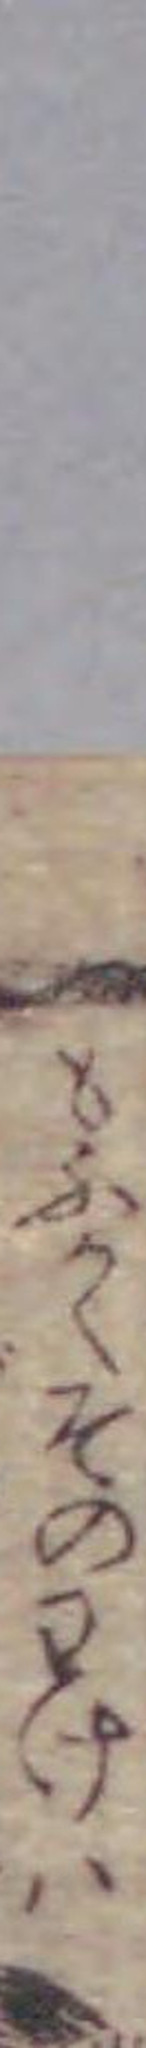もふかくそのわけは
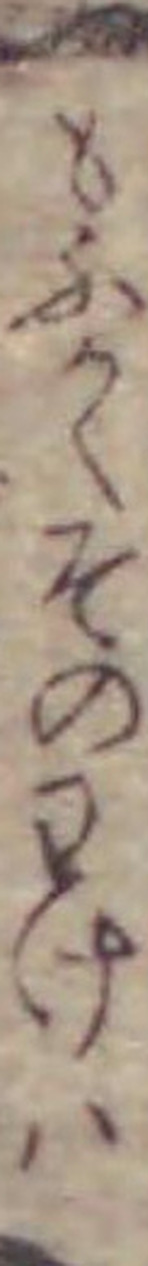もふかくそのわけは
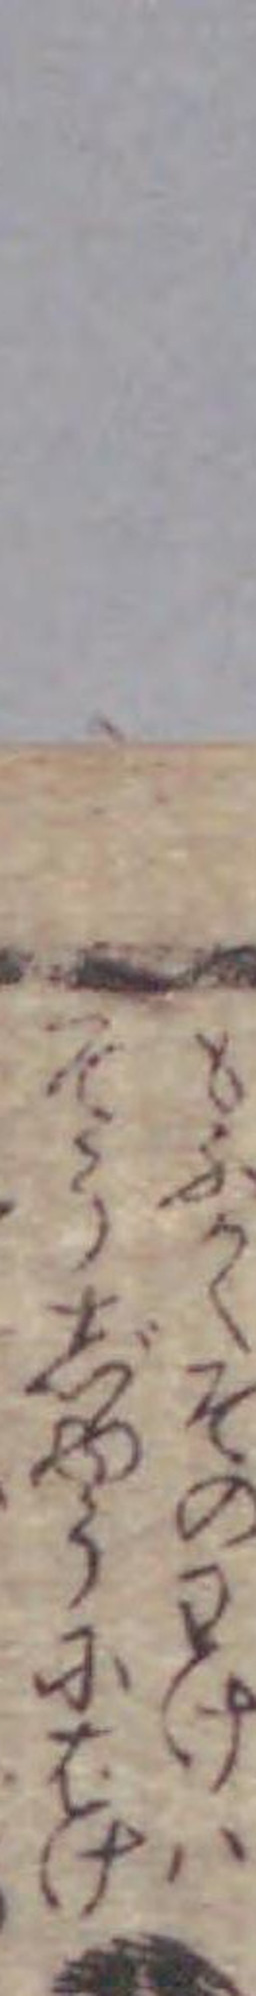そうじゆうにばけ
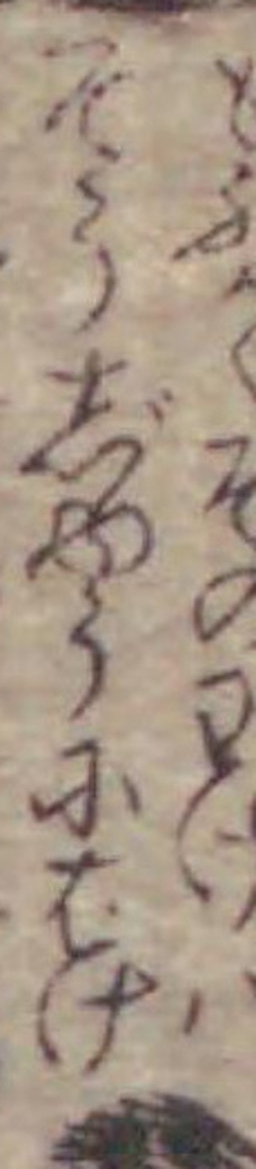そうじゆうにばけ
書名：化物仲間破 : 2巻
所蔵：国立国会図書館 National Diet Library, JAPAN
